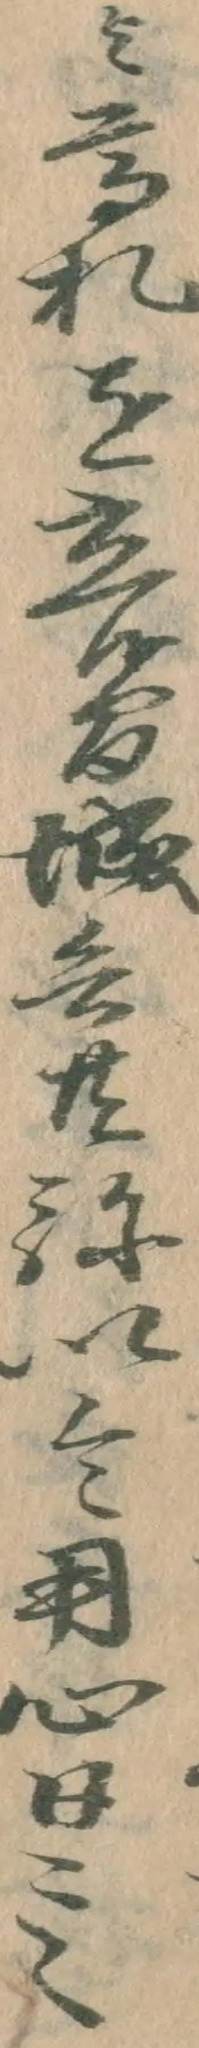と高札を立候間城兵共弥以令用心日に〳〵
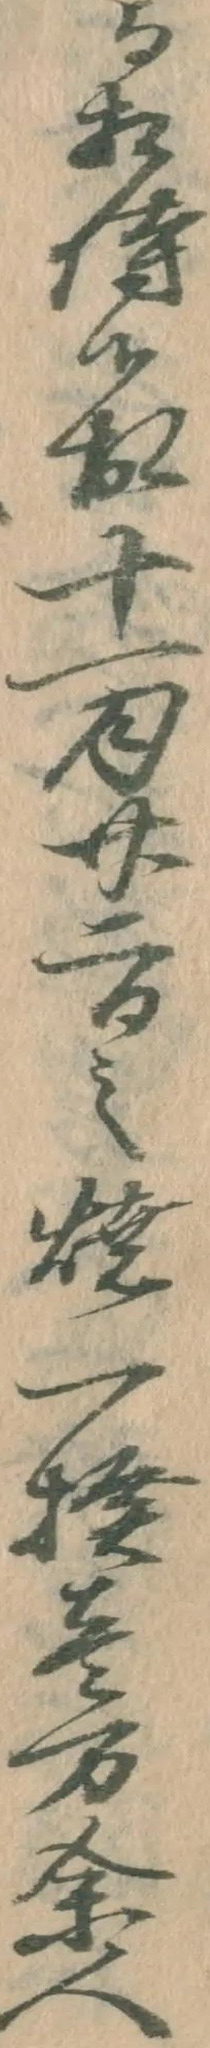と相待候故十一月廿二日之焼一揆壱万余人
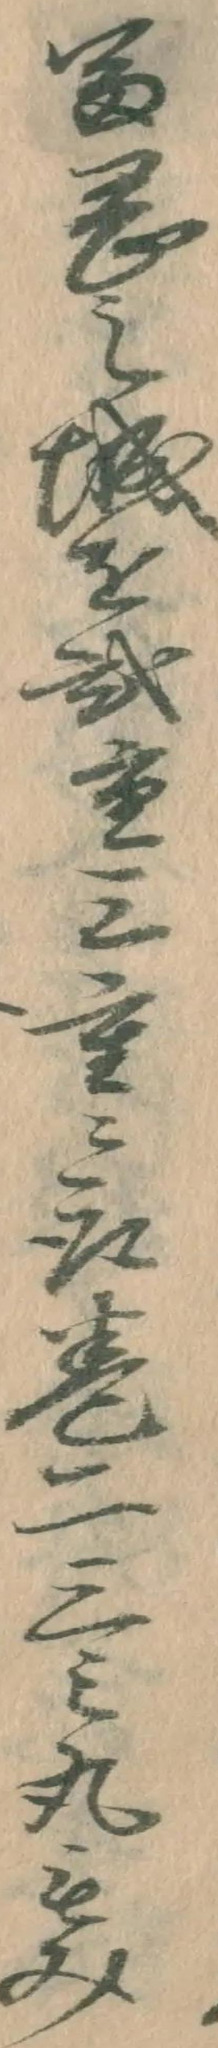富岡之城を弐重三重に取巻二三之丸もみ
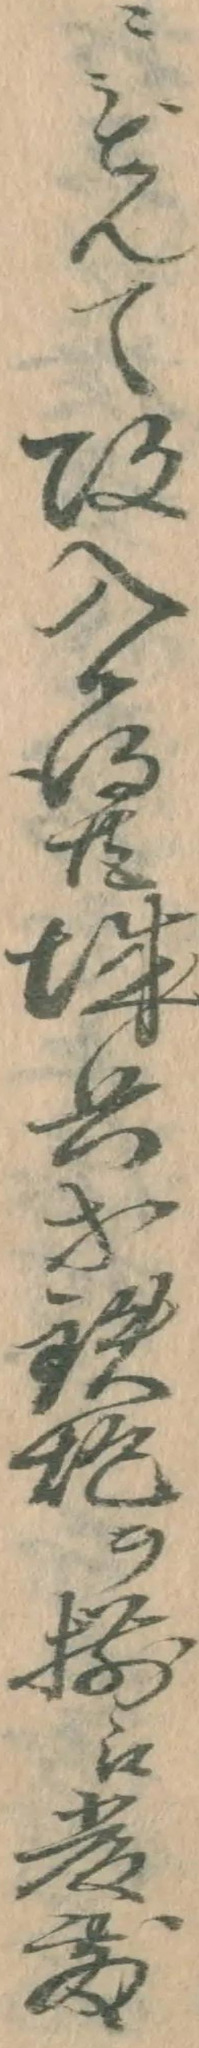にもんて攻入候得共城兵等鉄炮ヲ揃え厳敷

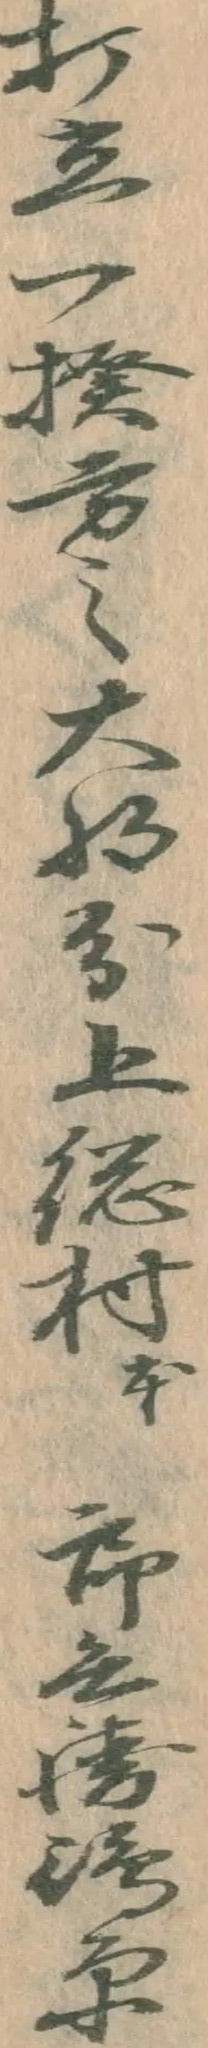打立一揆方之大将分上総村本郎兵衛島原
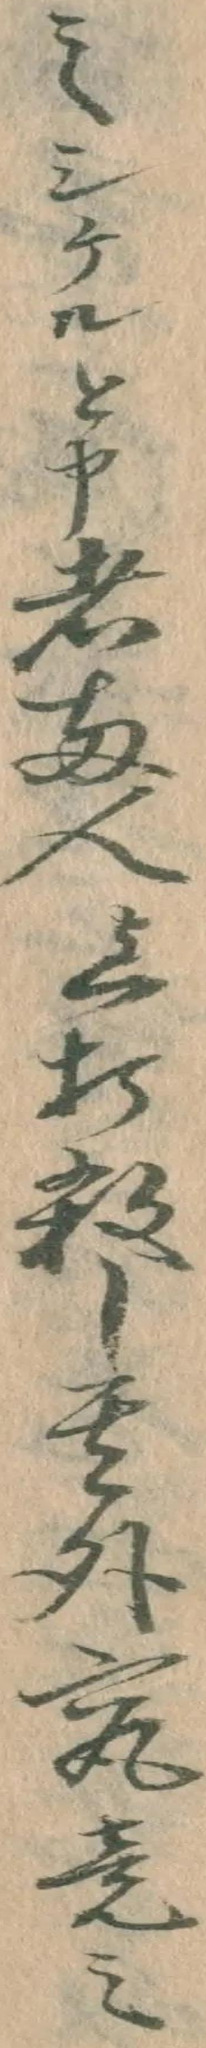之シケルと申者両人は打殺し其外究竟之
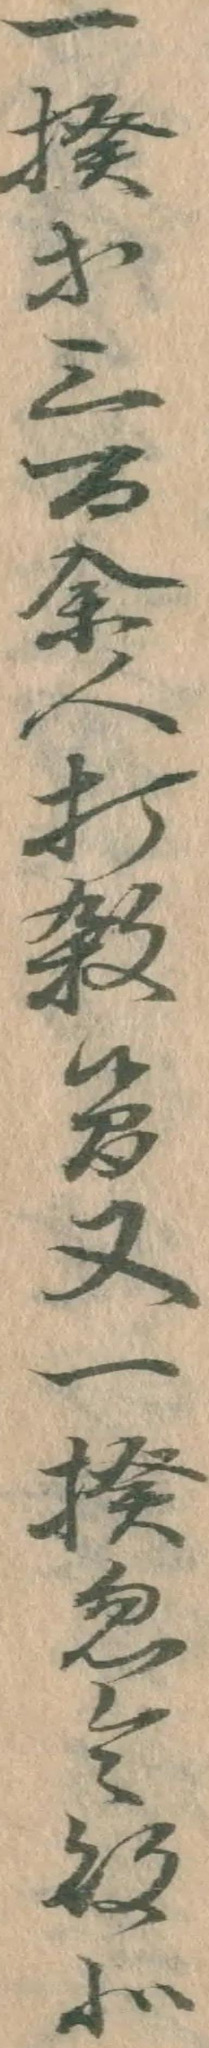一揆等三百余人打殺候間又一揆怱令敗北
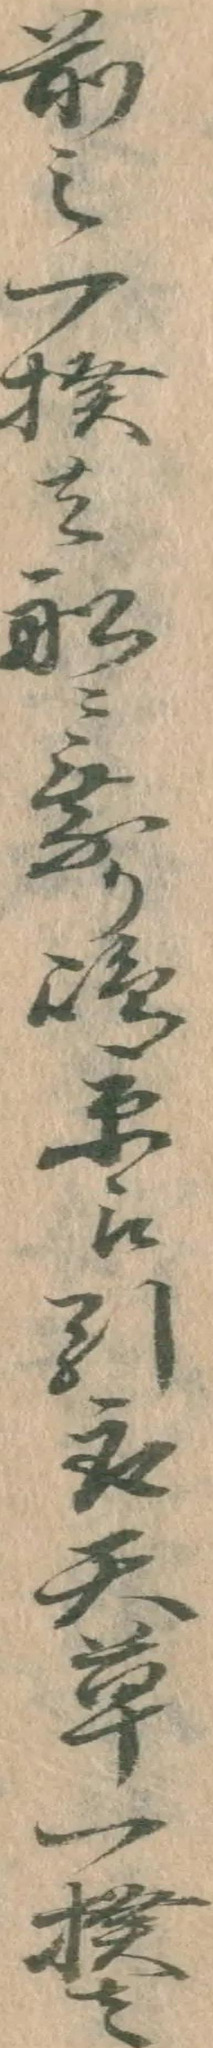前之一揆は船に乗り島原江引取天草一揆は
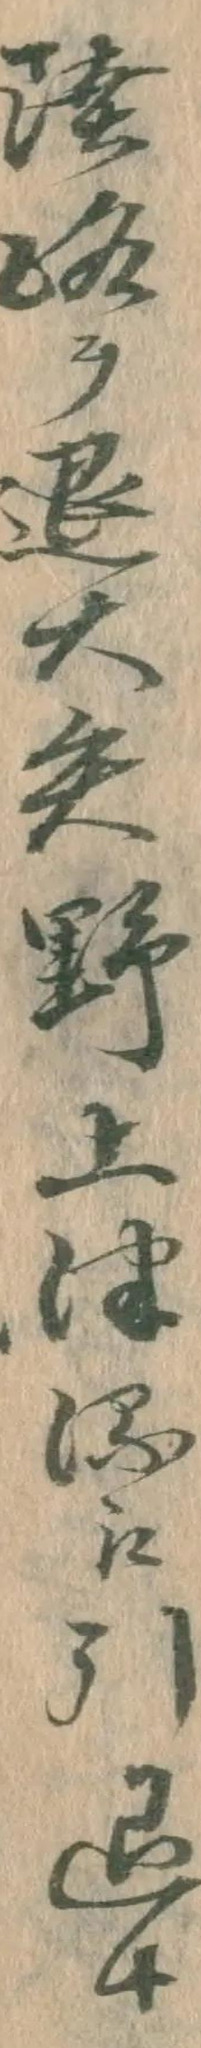陸路ヲ退大矢野上津流江引退候
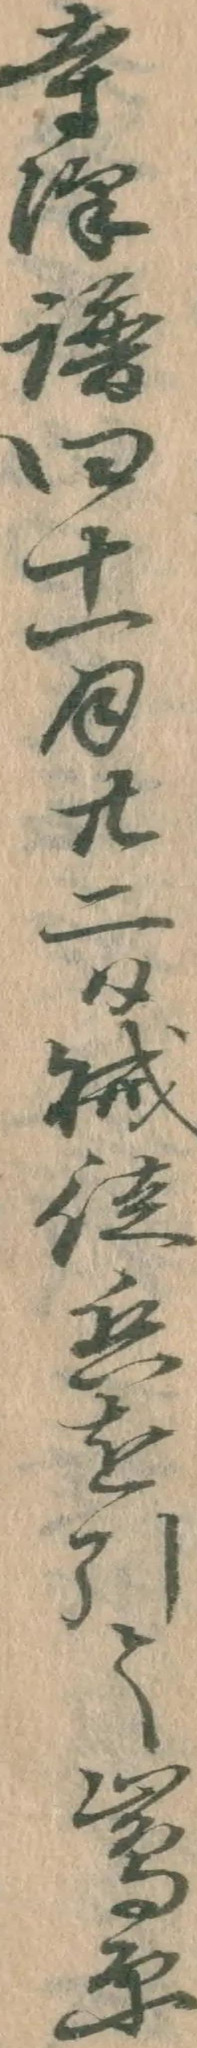寺沢譜曰十一月廿二日賊徒兵を引て島原
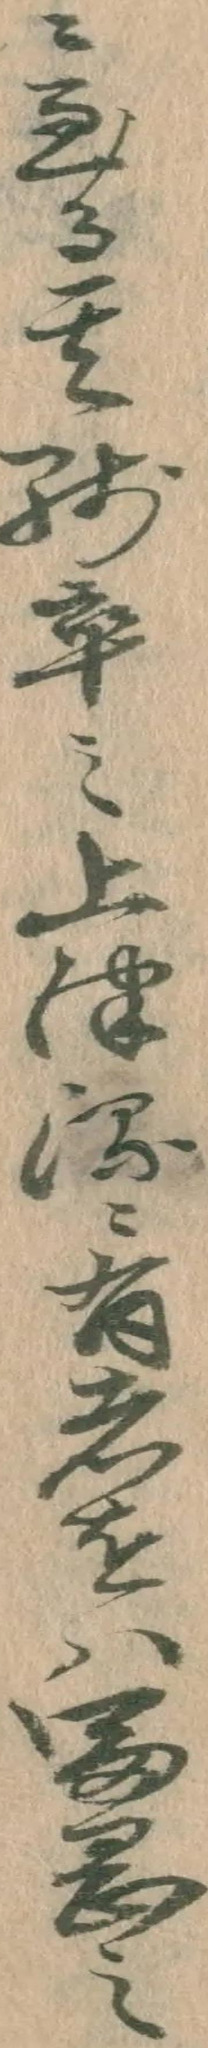に至る其残卒之上津流に有者をは富岡之
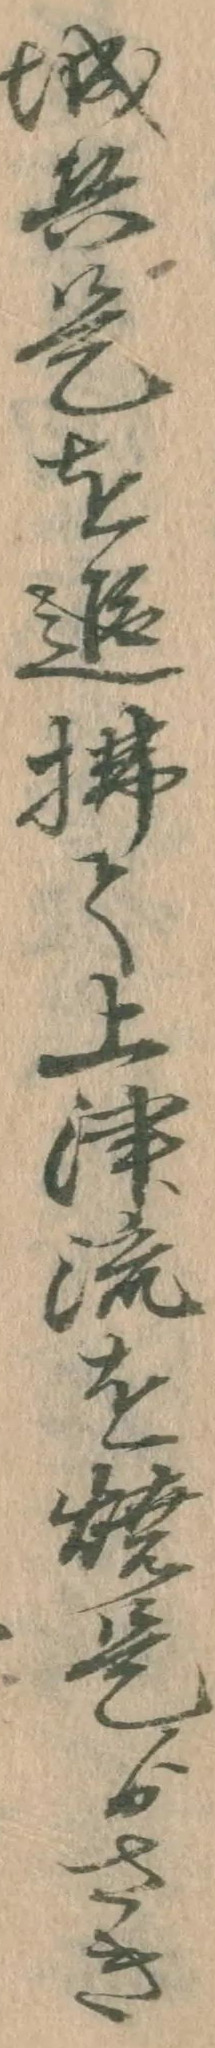城兵是を追払て上津流を焼是ゟさき
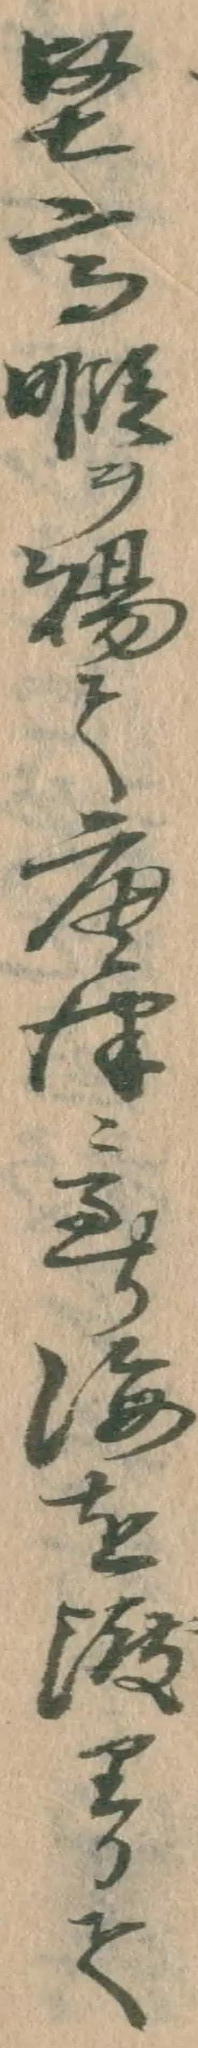堅高暇ヲ賜て唐津に至り海を渡りりて
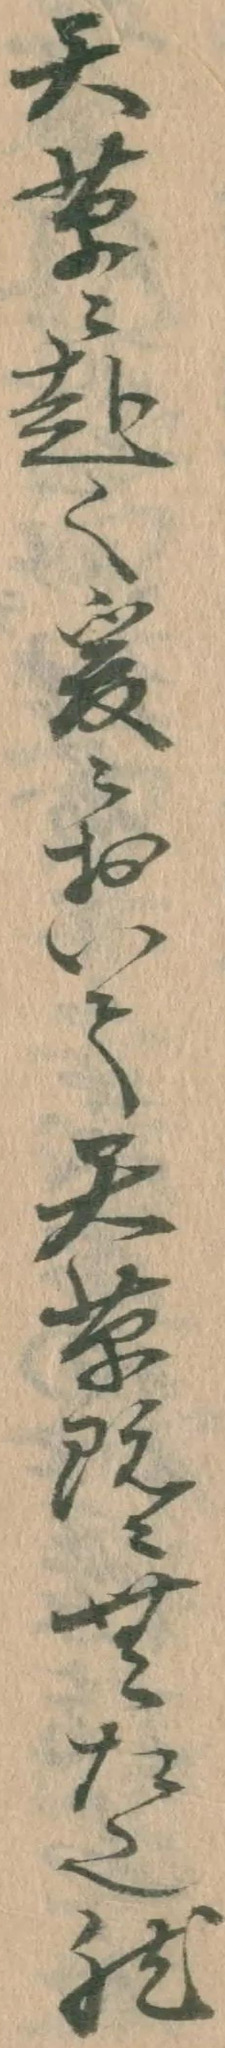天草に赴く爰において天草既に無た也然
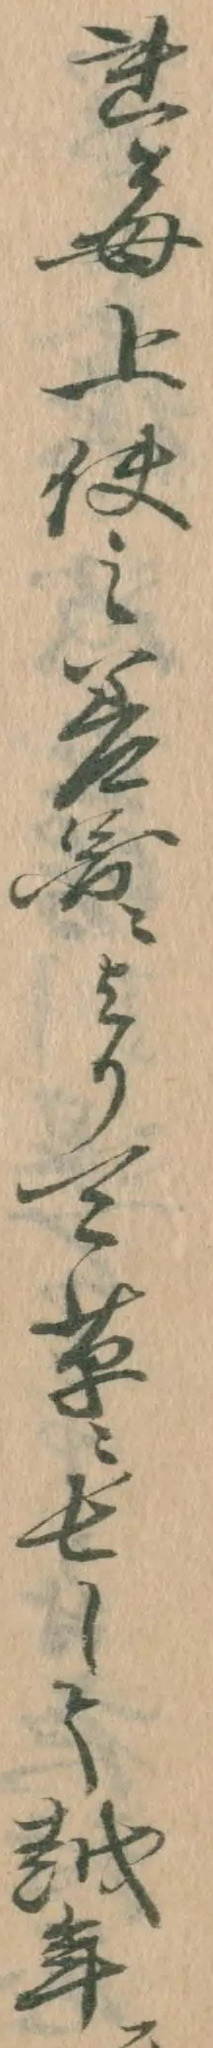れとも上使之差図により天草に長して越年ス
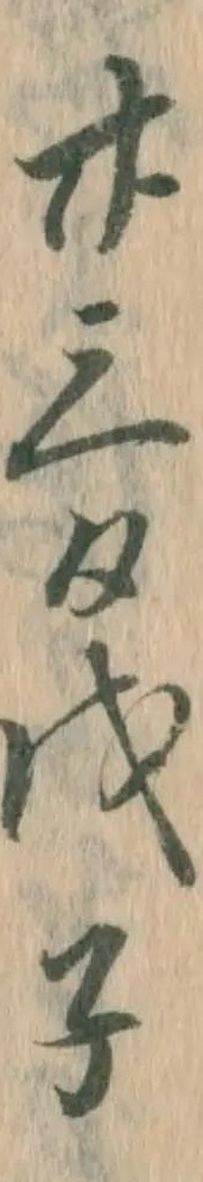廿三日戊子
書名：切支丹御退治記 49巻. [3]
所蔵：国立国会図書館 National Diet Library, JAPAN
